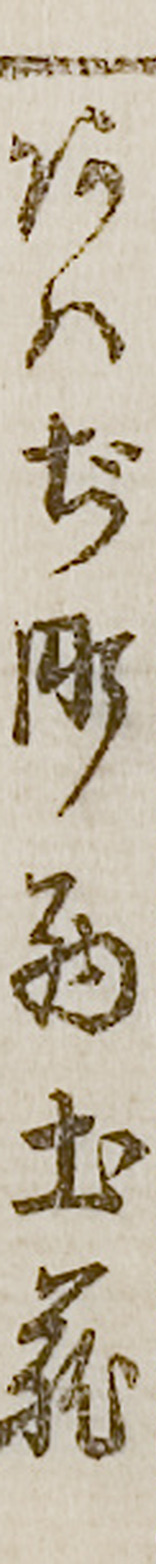あはぢ町西土蔵
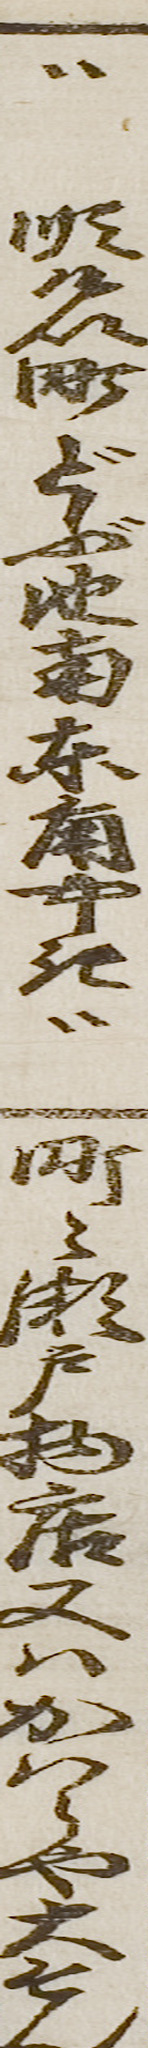〃順けい町どぶ池南東角やしき〃
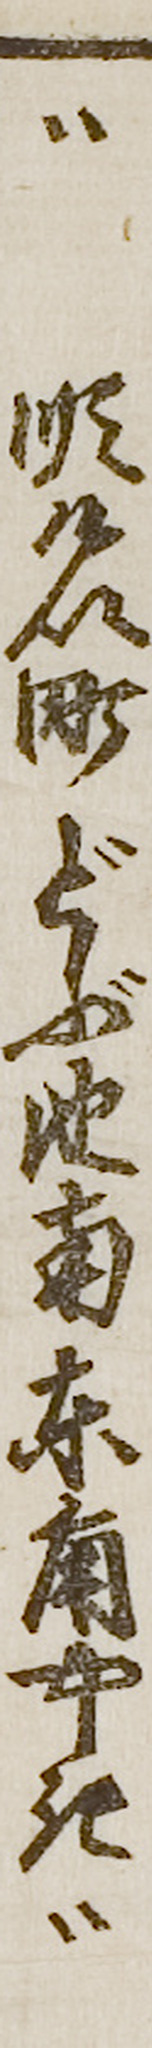〃順けい町どぶ池南東角やしき〃
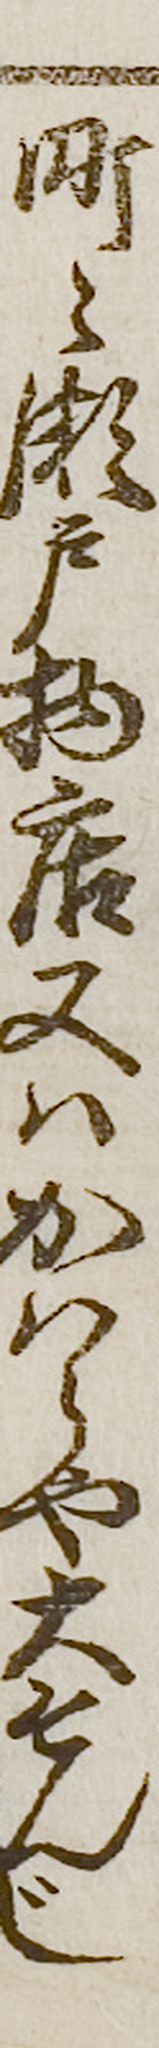町々瀬戸物店又はかはらや大そんじ
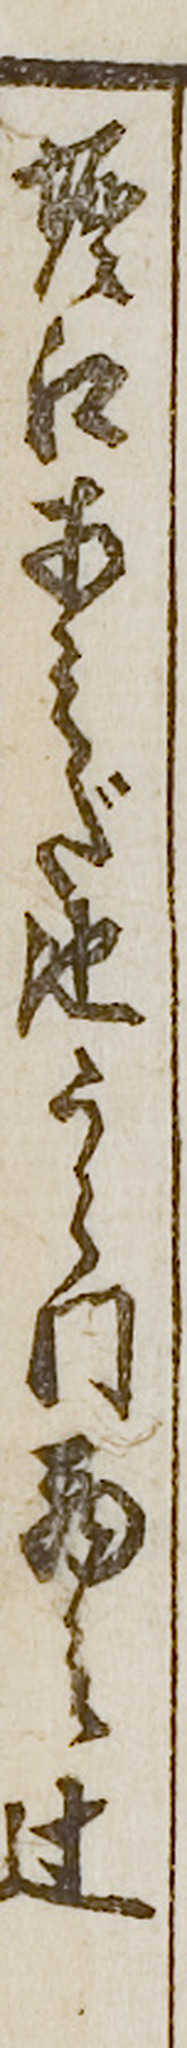堀江あみだ池うら門西の辻〃
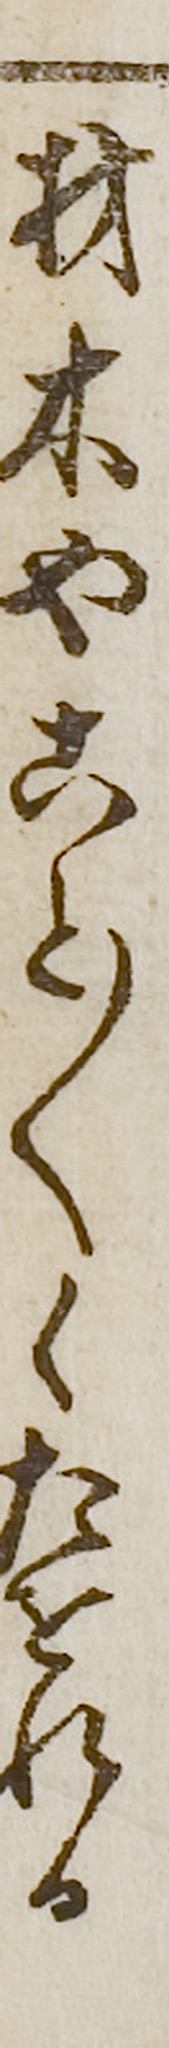材木やこと〳〵くたをれる
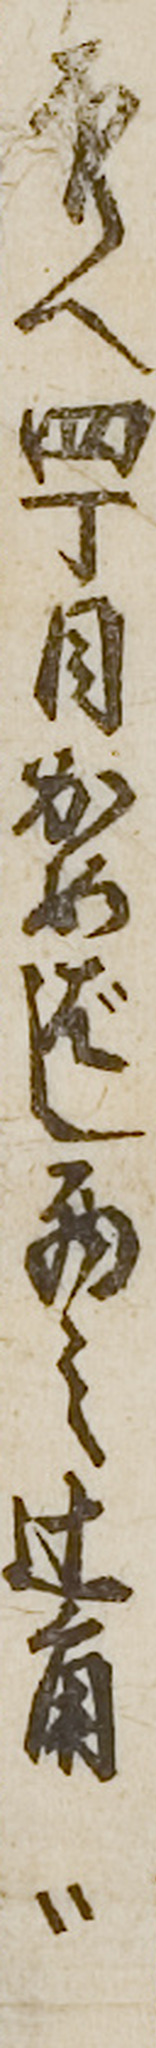南ほりへ四丁目かめばし西の辻角〃
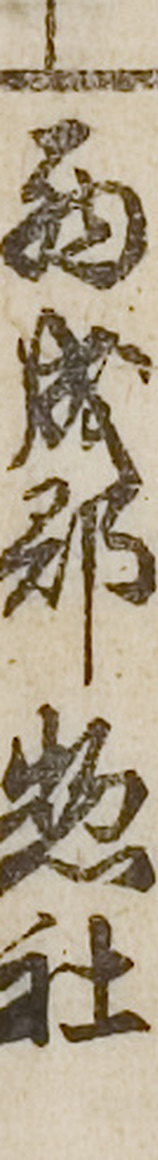西成郡惣社
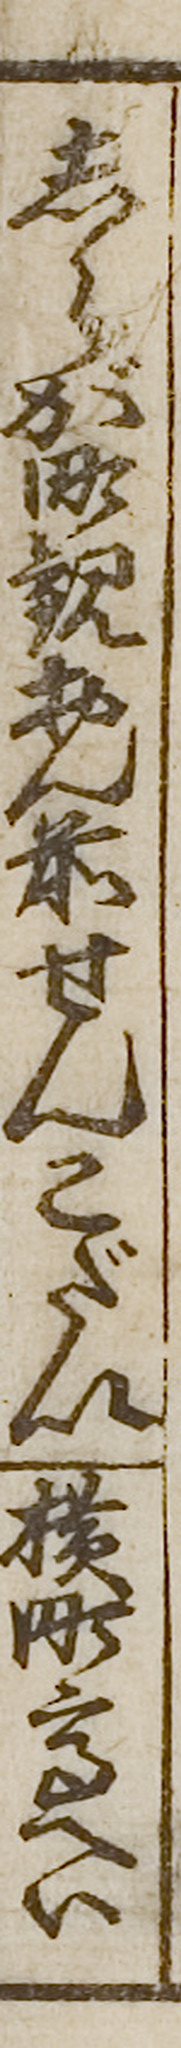しらが町観おん前せんこだい|横町高へい
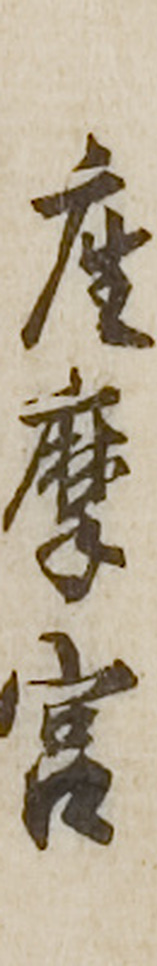座摩宮
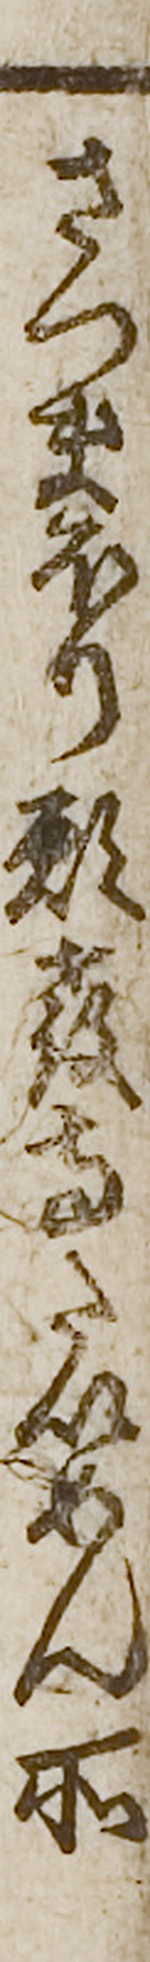さつまほり願教寺たいめん所
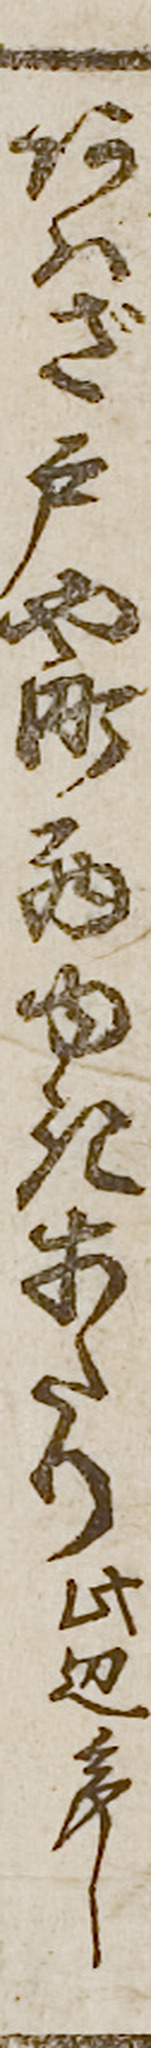あはざ戸や町西ゆきあたり此辺多し
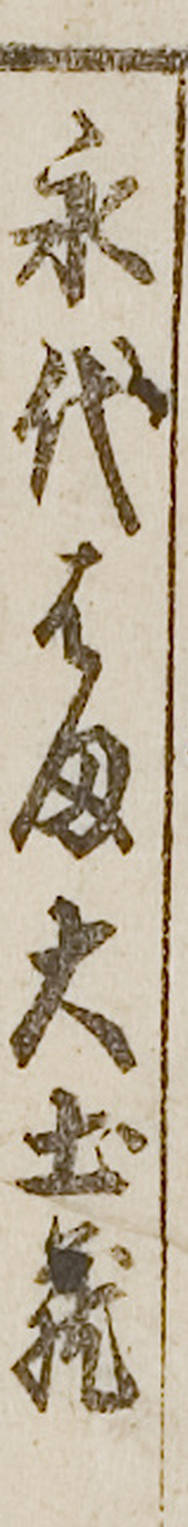永代はま大土蔵
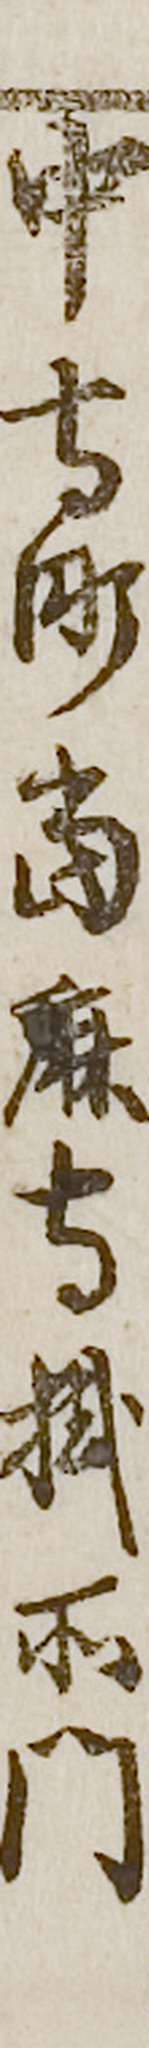中寺町当麻寺掛所門
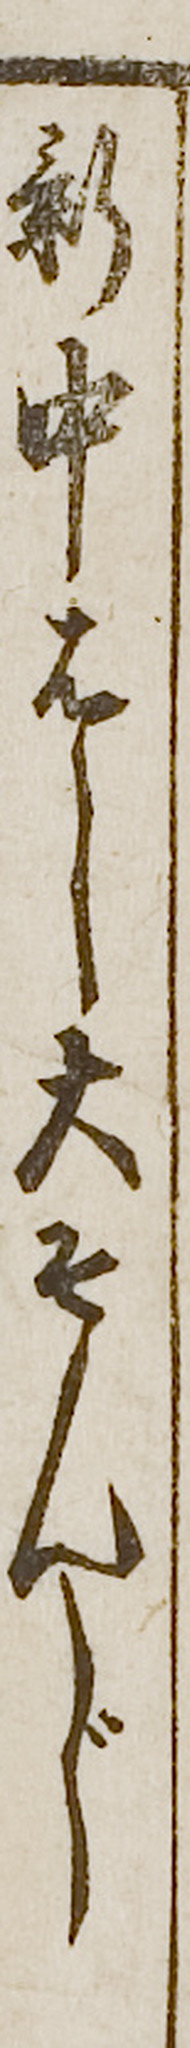新中はし大そんじ
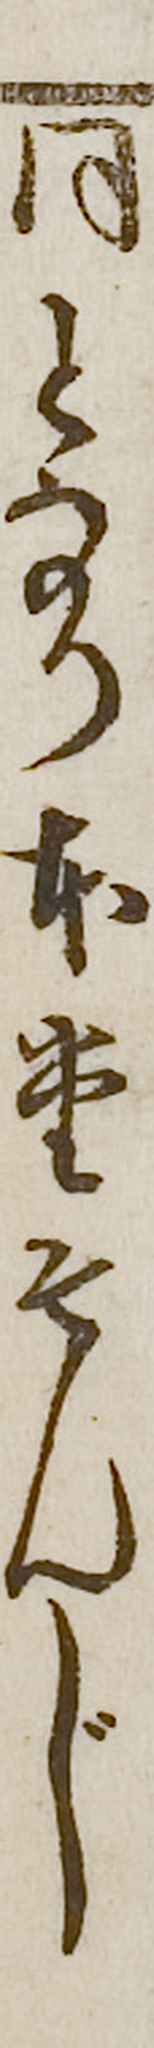同となり本堂そんじ
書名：摂津大ぢしん
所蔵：東京大学総合図書館 General Library in the University of Tokyo, JAPAN
